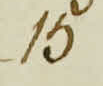15
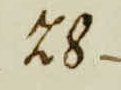28
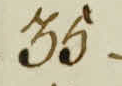35
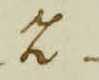2
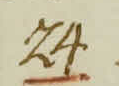24
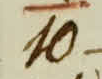10
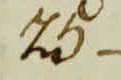25
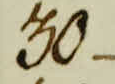30
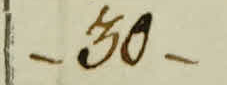- 30 -
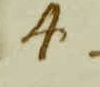4
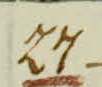27
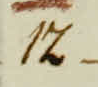12
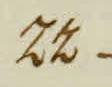22
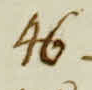46
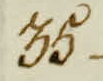35
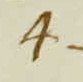4
